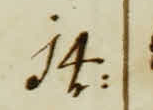14:
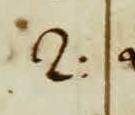2:
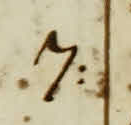7:
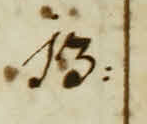13:
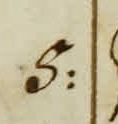5:
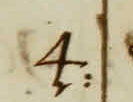4:
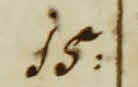15:
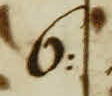6:
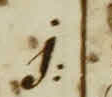1:
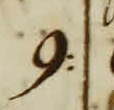9:
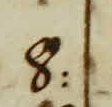8:
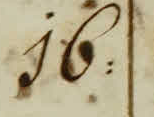16:
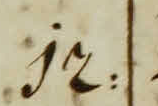12:
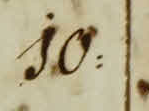10:
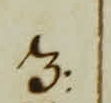3:
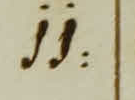11:
